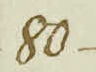80
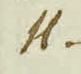11
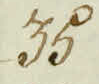35
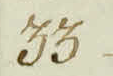33
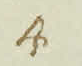4
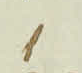1
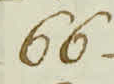66
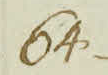64
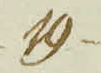19
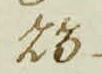23
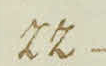22
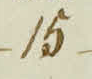15
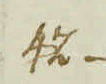42
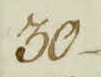30
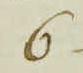6
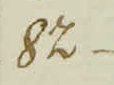82
